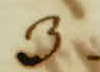3
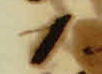1
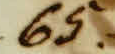65
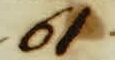61
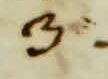3
